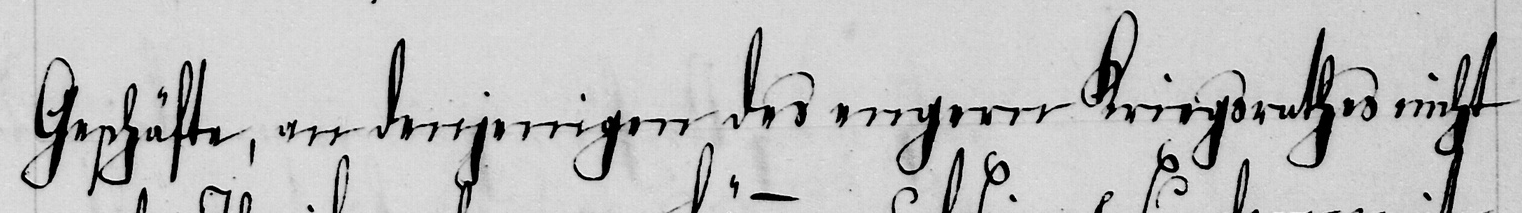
Geschäfte, an denjenigen des engern Kriegsrathes nicht
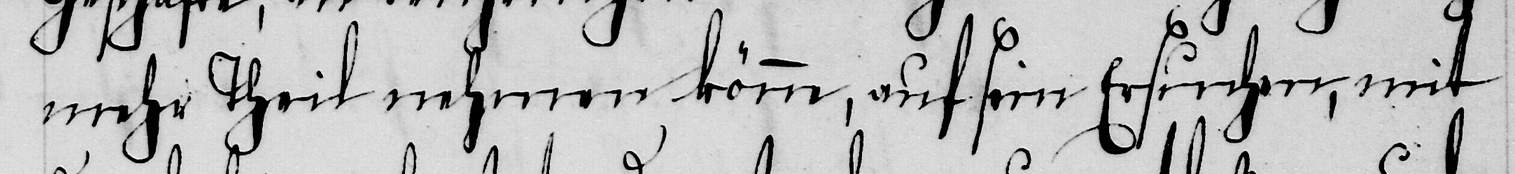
mehr Theil nehmen könne, auf sein Ersuchen, mit
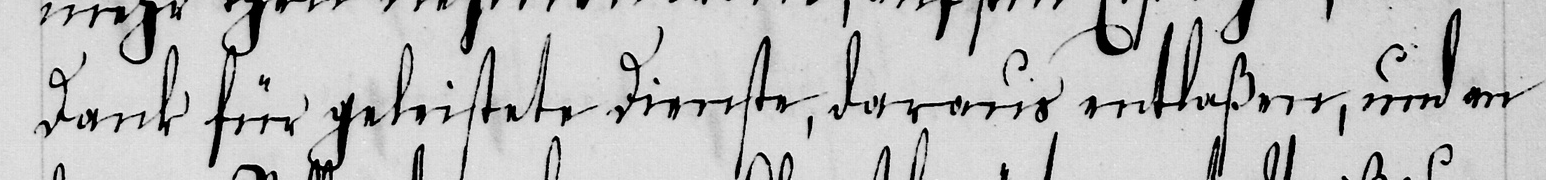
Dank für geleistete Dienste, daraus entlaßen, und an
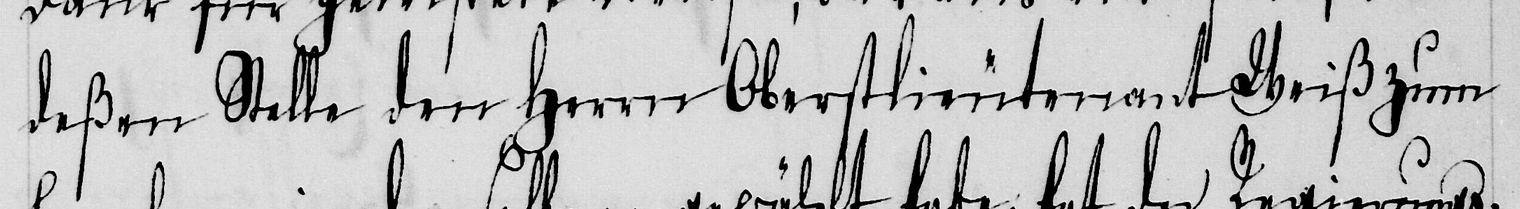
deßen Stelle den Herrn Oberstlieutenant Weiß zum
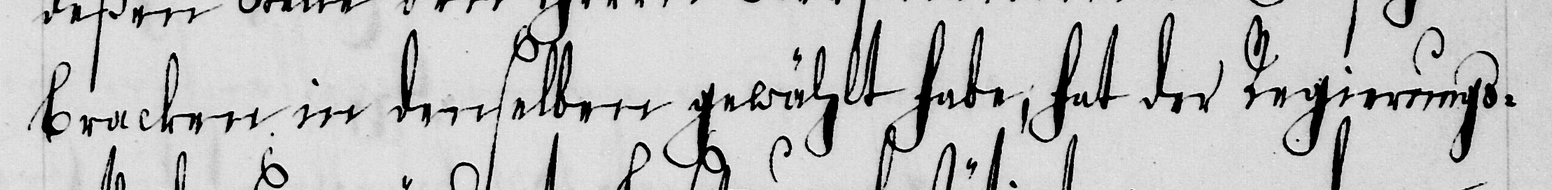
Bracken in denselben gewählt habe, hat der Regierungs¬
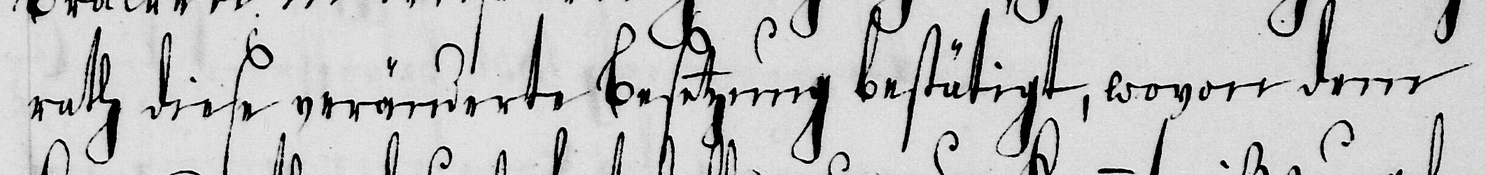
rath diese veränderte Besetzung bestätigt, wovon dem
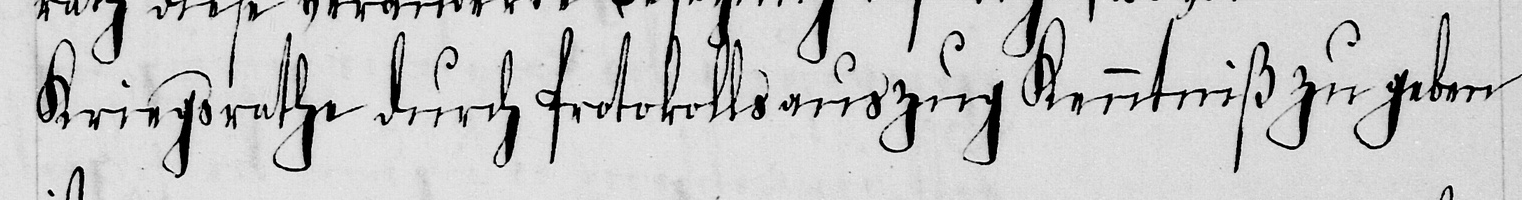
Kriegsrathe durch Protokollsauszug Kenntniß zu geben
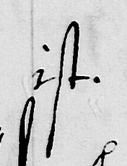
st.
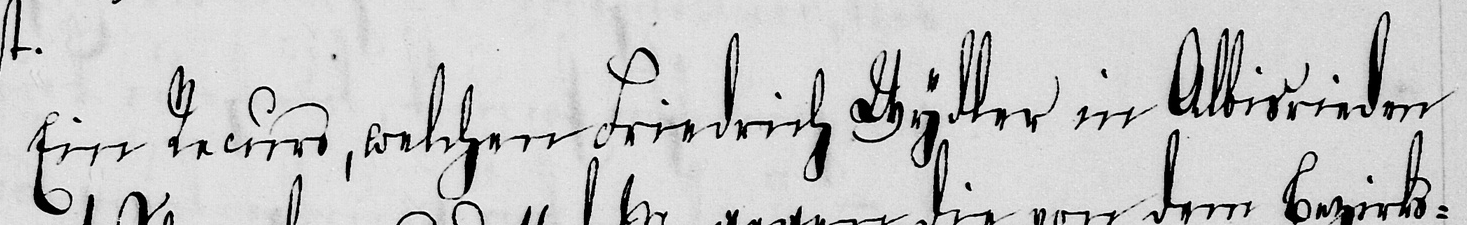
Ein Recurs, welchen Friedrich Wydler in Albisrieden
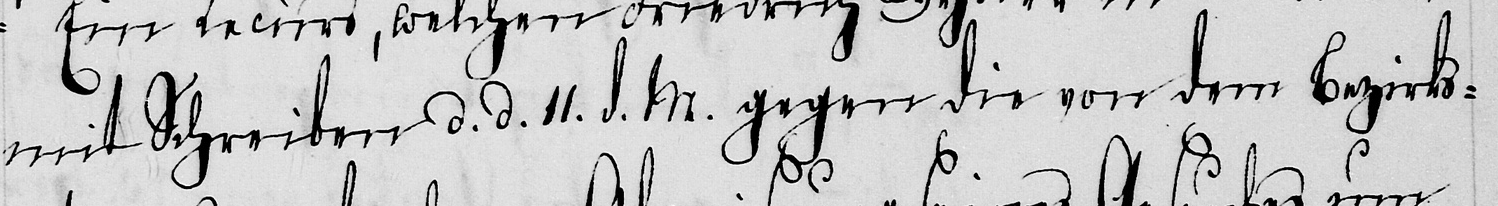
mit Schreiben d. d. 11. d. M. gegen die von dem Bezirks¬
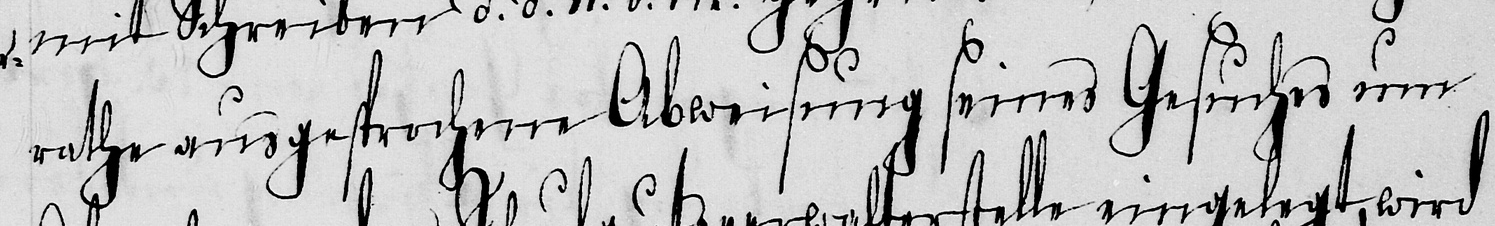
rathe ausgesprochene Abweisung seines Gesuches um
